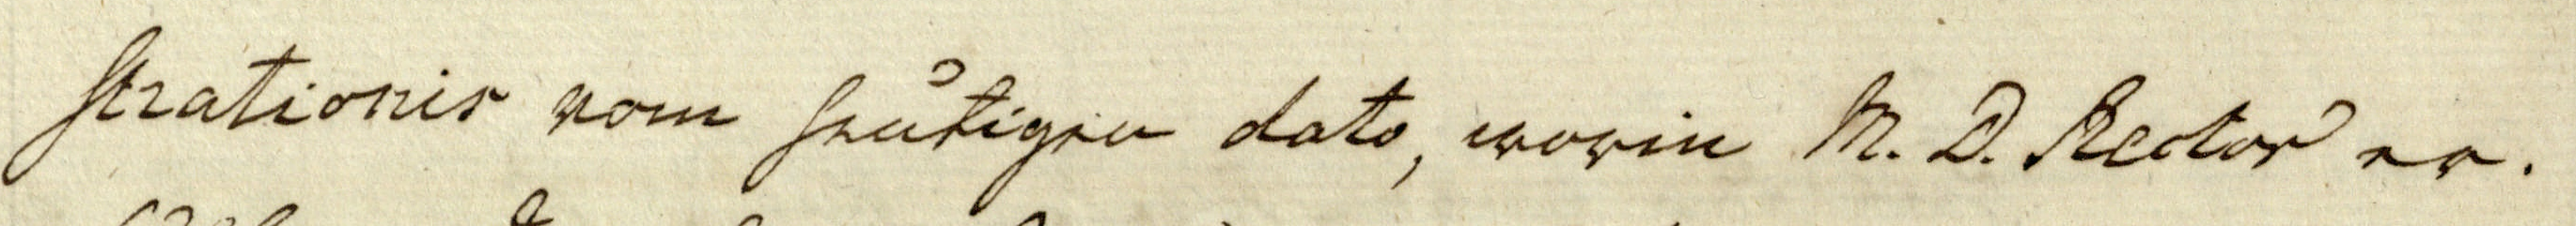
strationis vom heutigen dato, worin M. D. Rector er¬
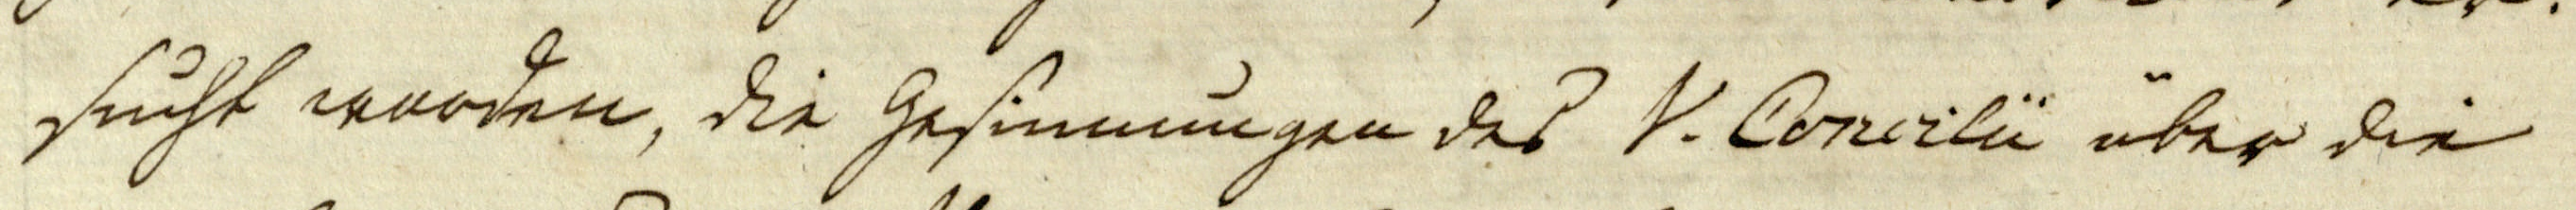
sucht worden, die Gesinnungen des V. Concilii über die
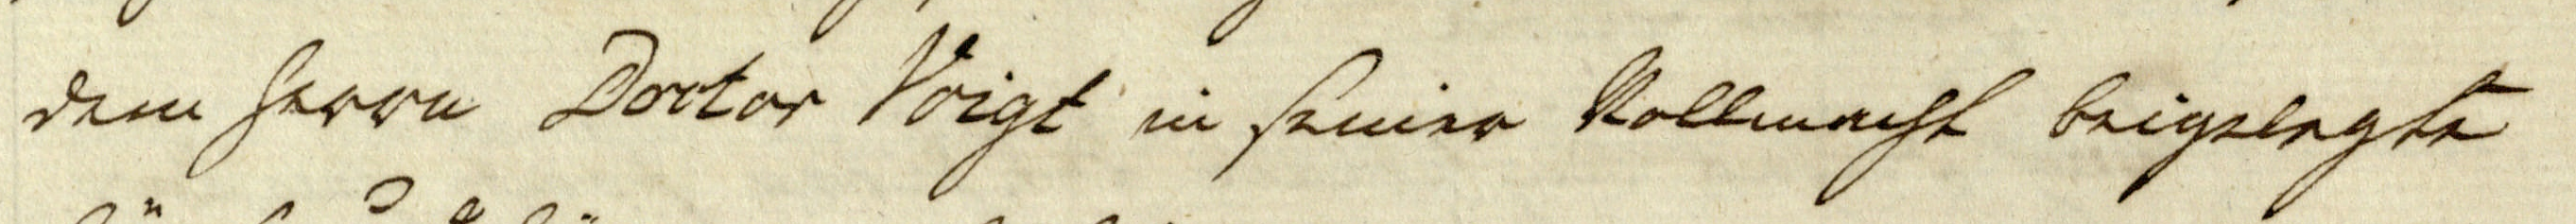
dem herrn Doctor Voigt in seiner Vollmacht beigelegte
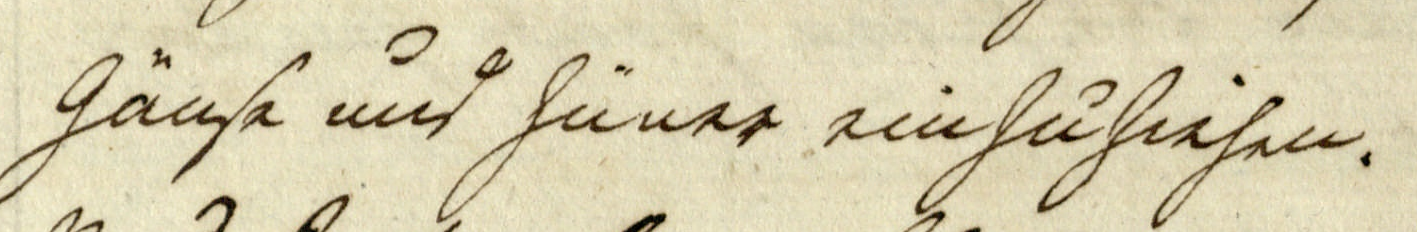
Gänse und Hüner einzuziehen.
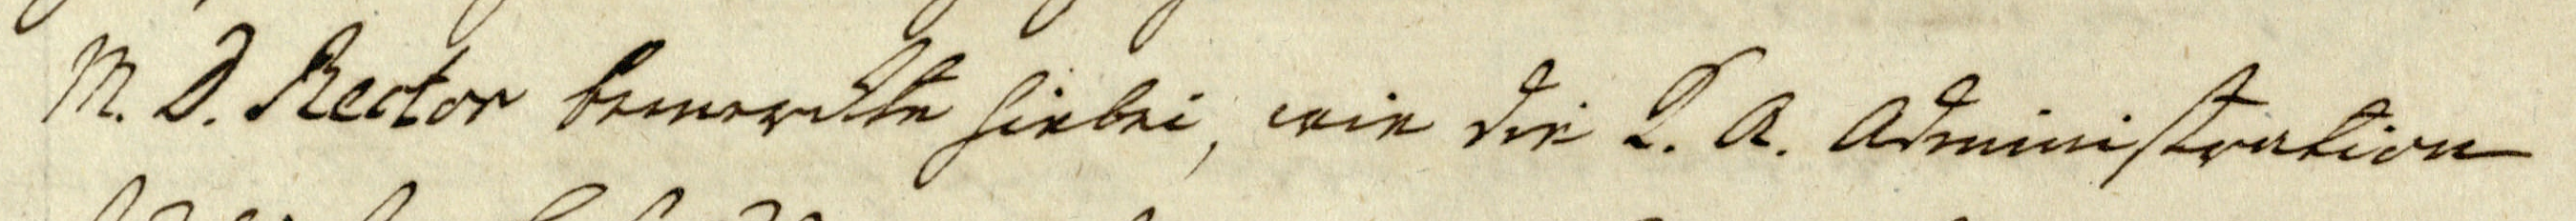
M. D. Rector bemerckte hiebei, wie die K. A. Administration
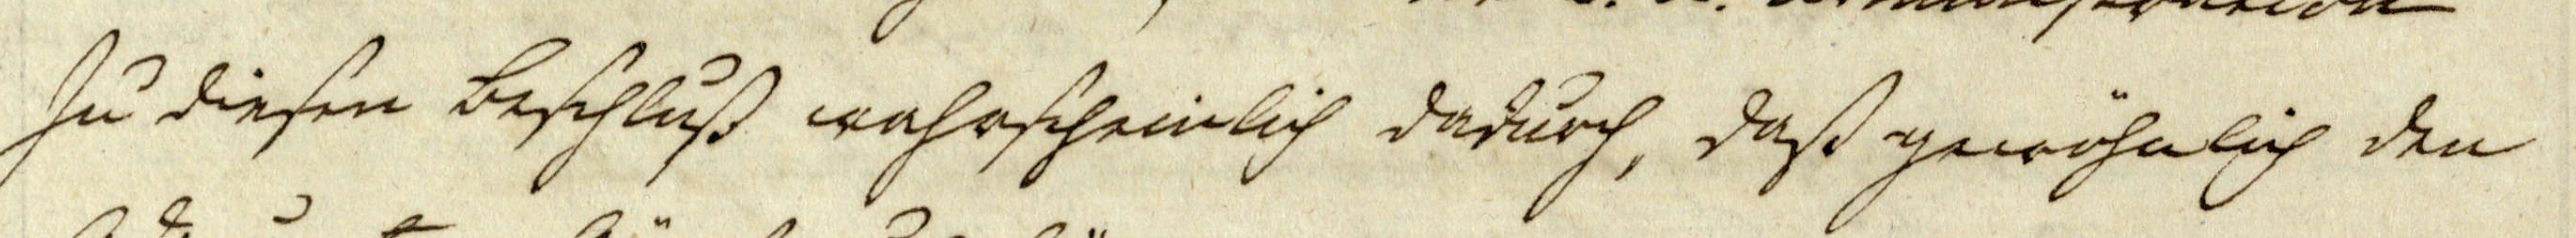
zu diesem Beschluß wahrscheinlich dadurch, daß gewöhnlich den
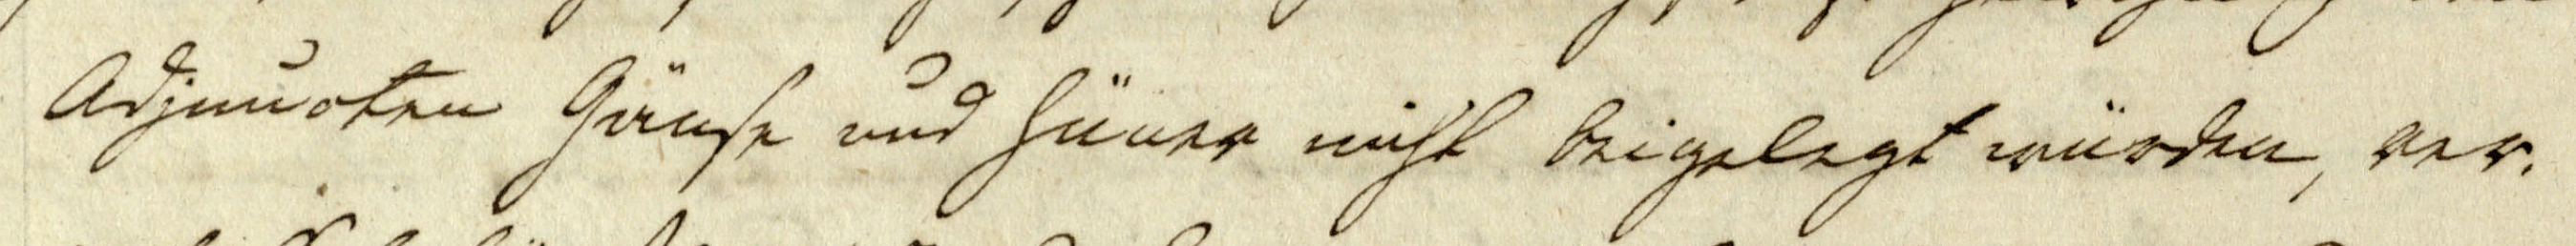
Adjuncten Gänse und Hüner nicht beigelegt würden, ver¬
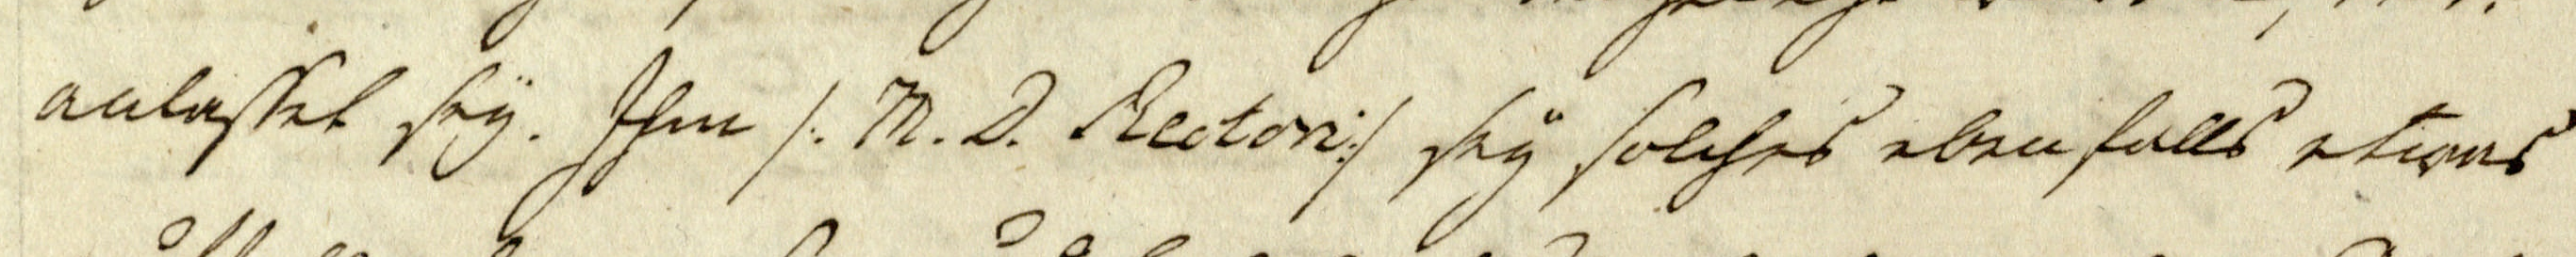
anlasset seÿ. Ihm / M. D. Rectori / seÿ solches ebenfalls etwas
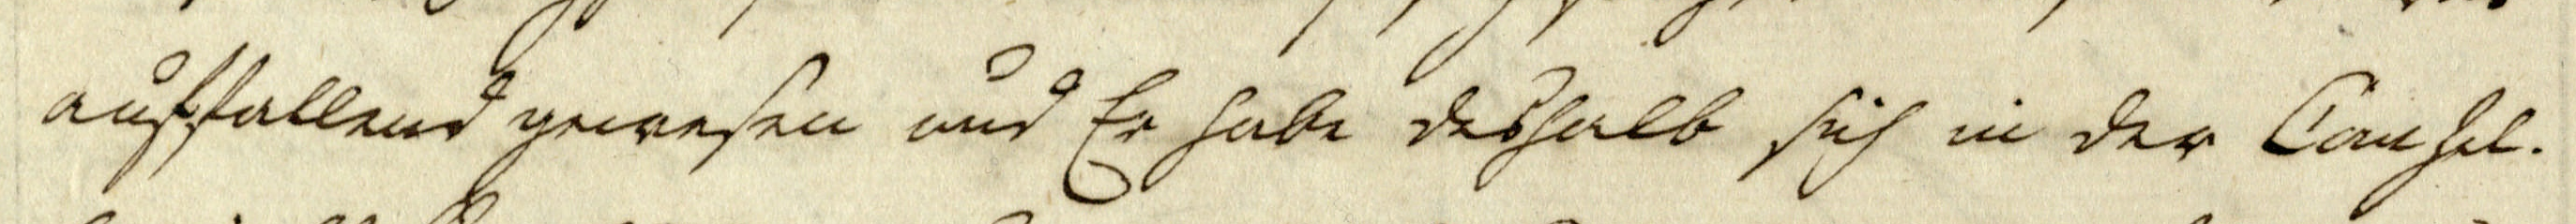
auffallend gewesen und Er habe deshalb sich in der Canzel¬
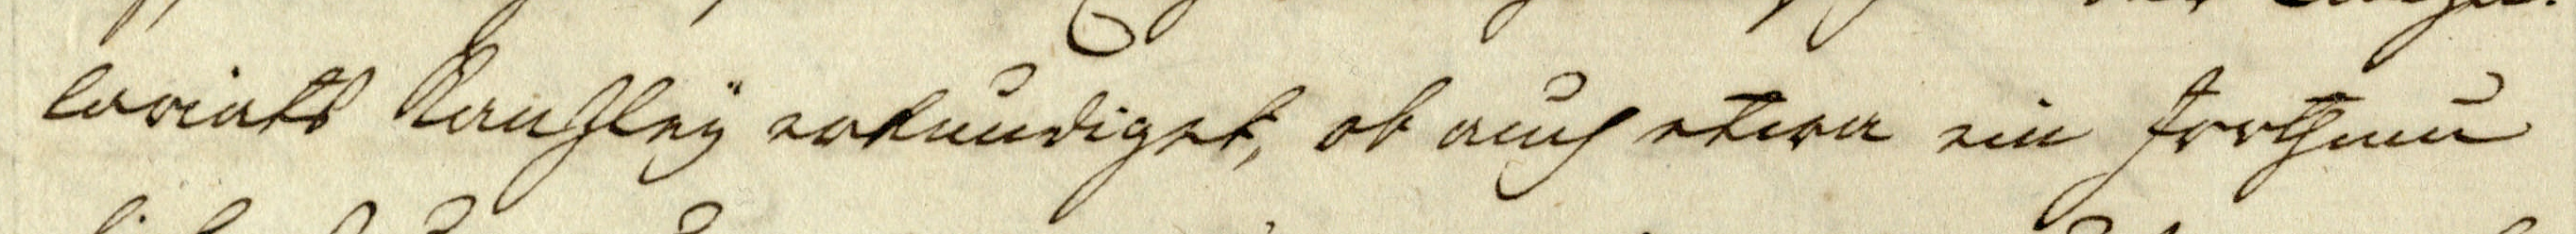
lariats Kanzleÿ erkundiget, ob auch etwa ein Irrthum
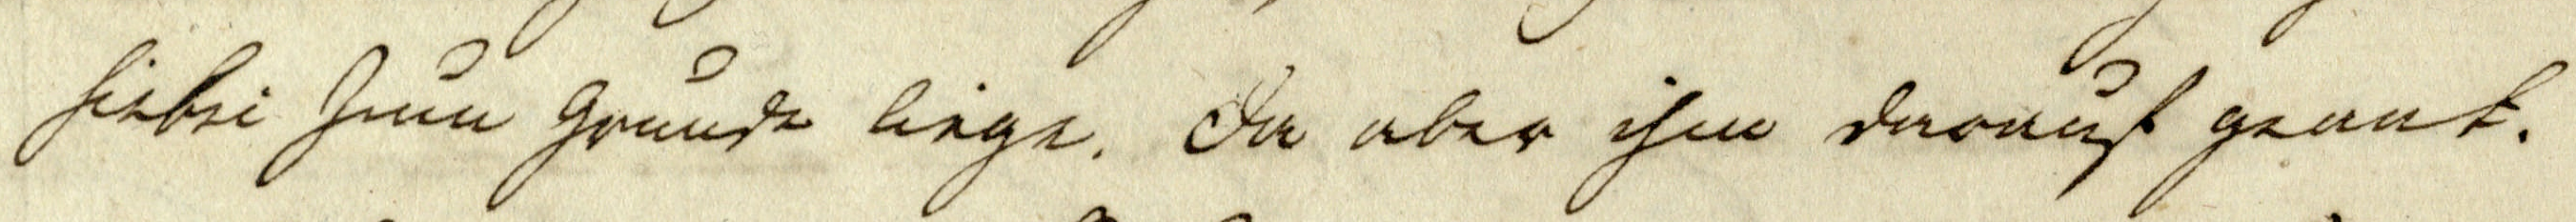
hiebei zum Grunde liege. Da aber ihm darauf geant¬
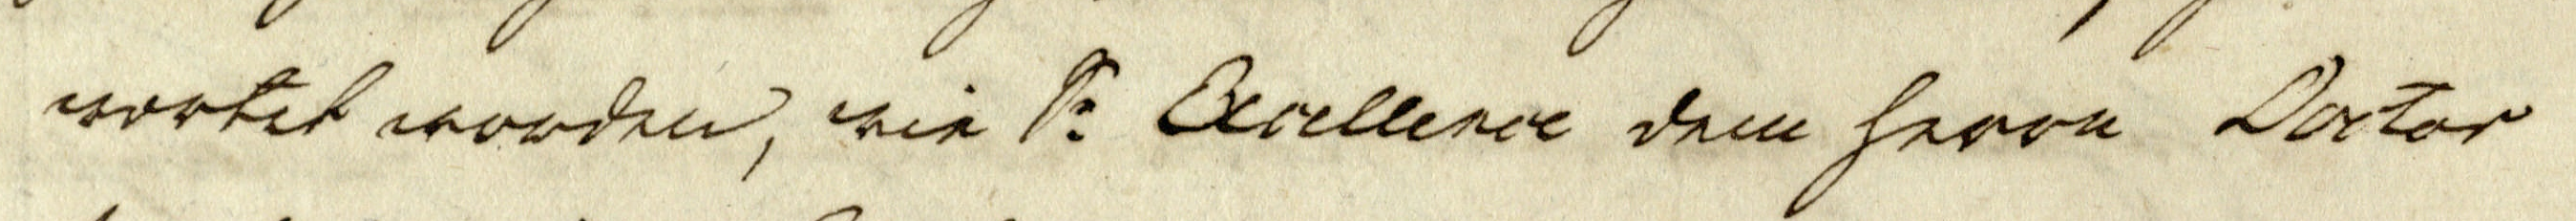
wortet worden, wie Sr. Excellence dem herrn Doctor
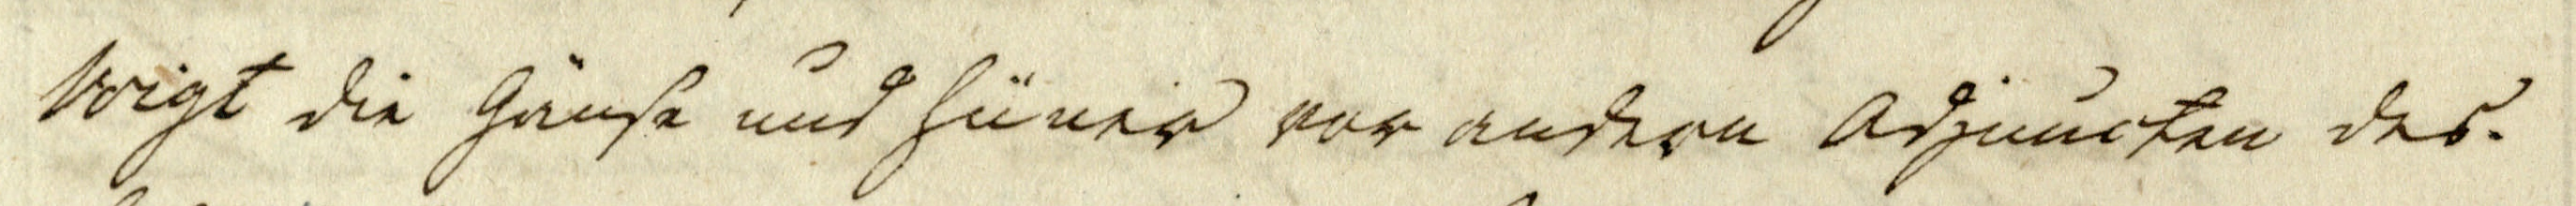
Voigt die Gänse und Hüner vor andern Adjuncten des¬
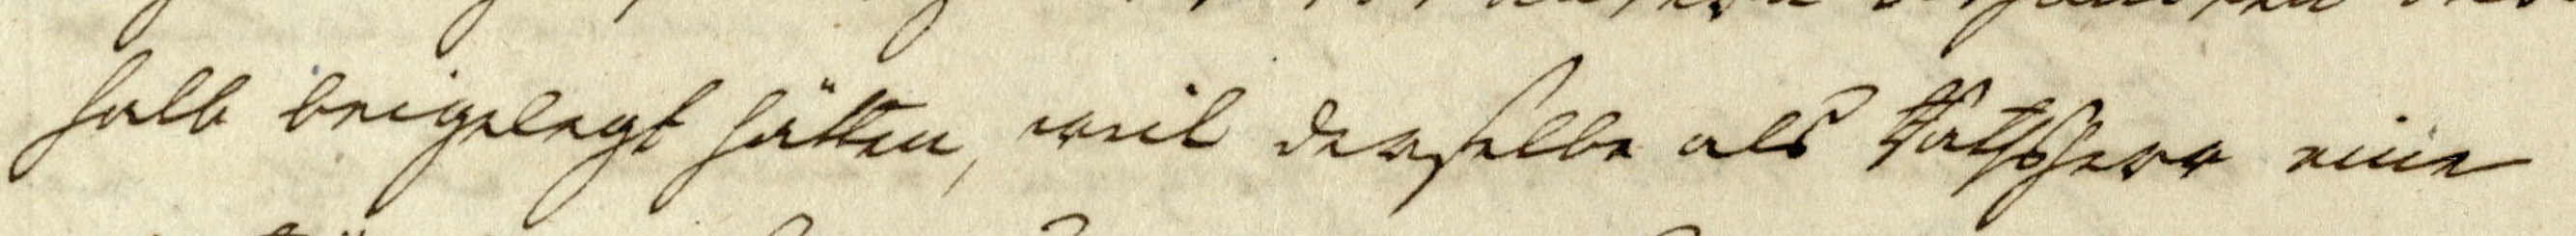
halb beigelegt hätten, weil derselbe als Rathsherr eine
